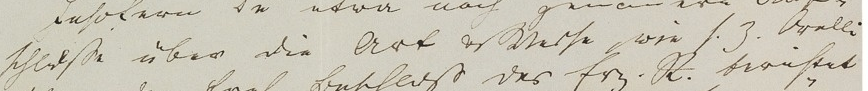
schlüße über die Art & Weise wie s. Z. Orelli
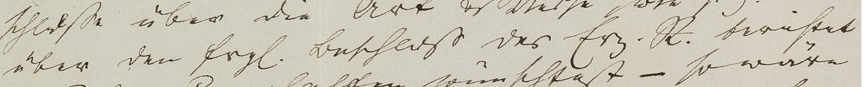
über den frgl. Beschluß des Erz.R. berichtet
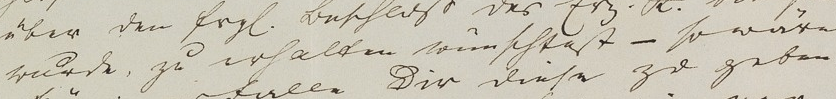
wurde, zu erhalten wünschtest – so wäre
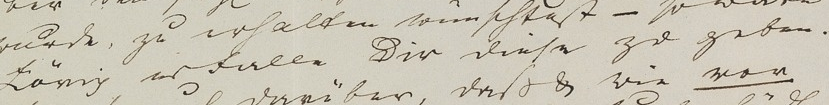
Löwig im Falle Dir diese zu geben.
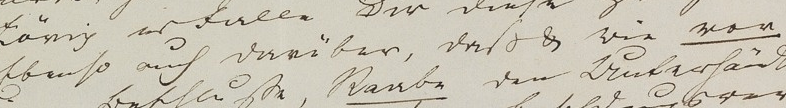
Ebenso auch darüber, daß & wie vor
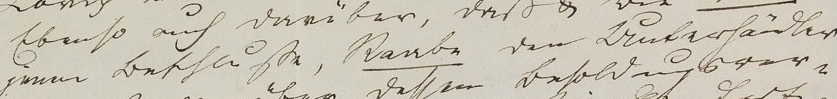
jenem Beschluße, Raabe den Unterhändler
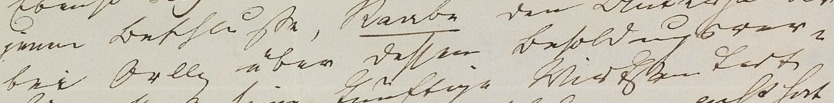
bei Orelli über dessen Besoldungsver-
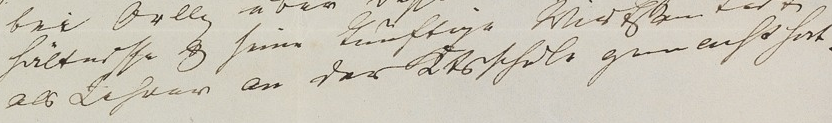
als Lehrer an der Ktsschule gemacht hat.
